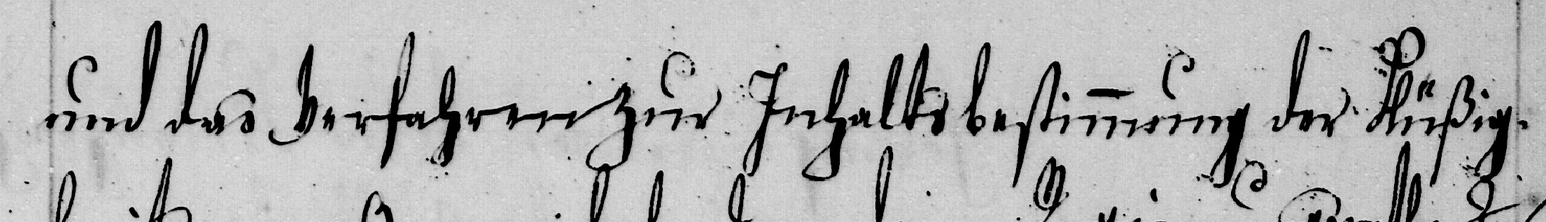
und das Verfahren zur Inhaltsbestimmung der Flüßig¬
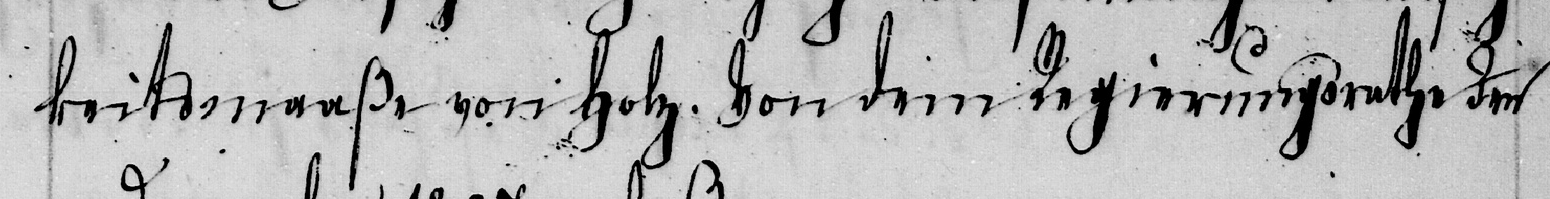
keitsmaaße von Holz. Von dem Regierungsrathe den
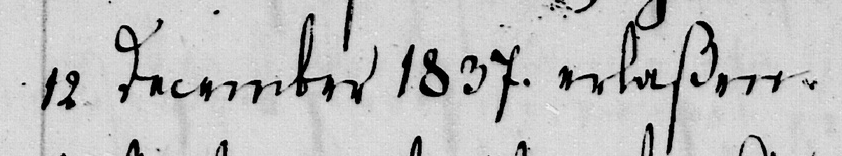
12 December 1837. erlaßen.
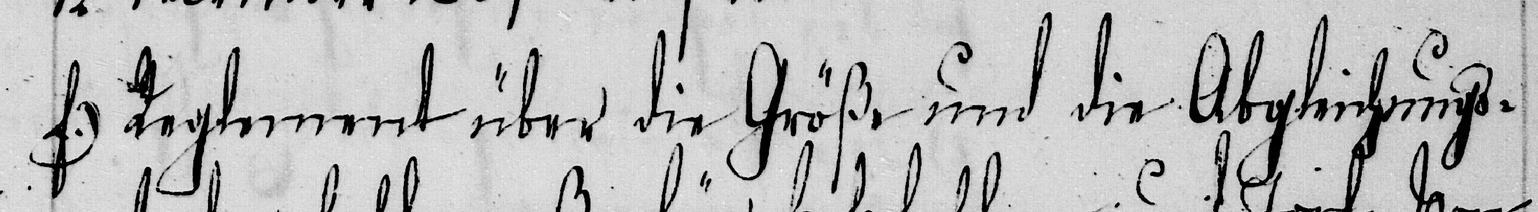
f.) Reglement über die Größe und die Abgleichung¬
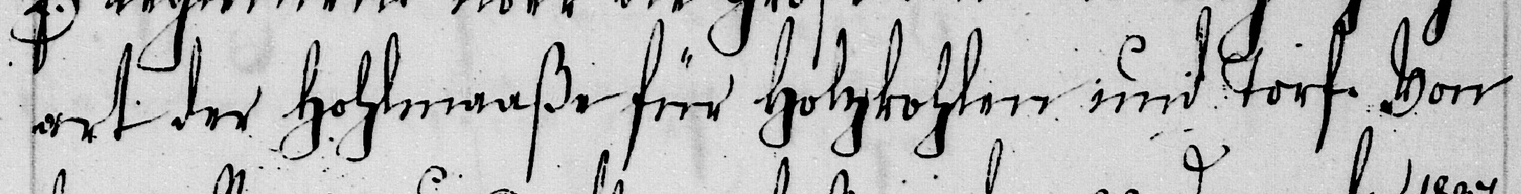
sart der Holzmaaße für Holzkohlen und Torf. Von
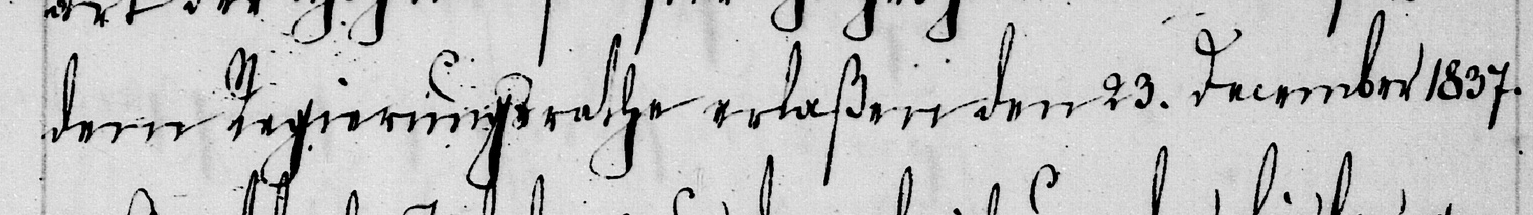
dem Regierungsrathe erlaßen den 23. December 1837.
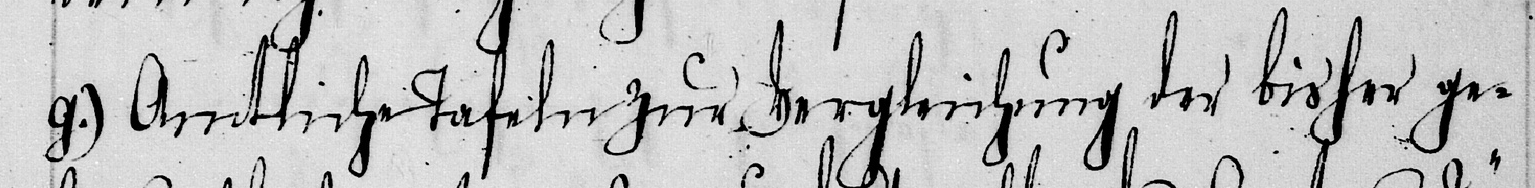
g.) Amtliche Tafeln zur Vergleichung der bisher ge¬
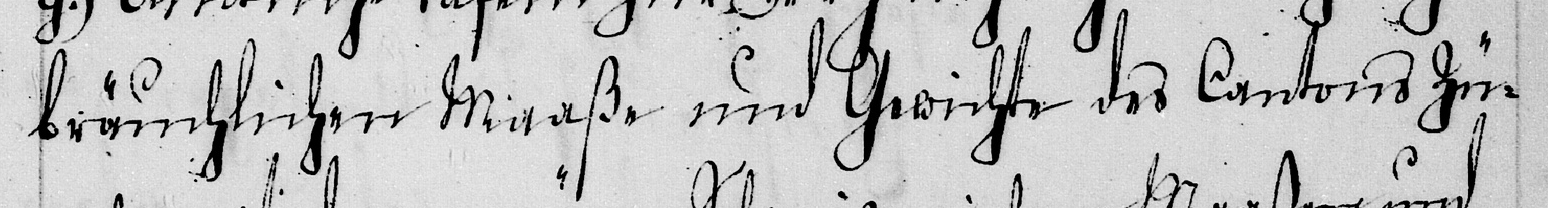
bräuchlichen Maaße und Gewichte des Cantons Zü¬
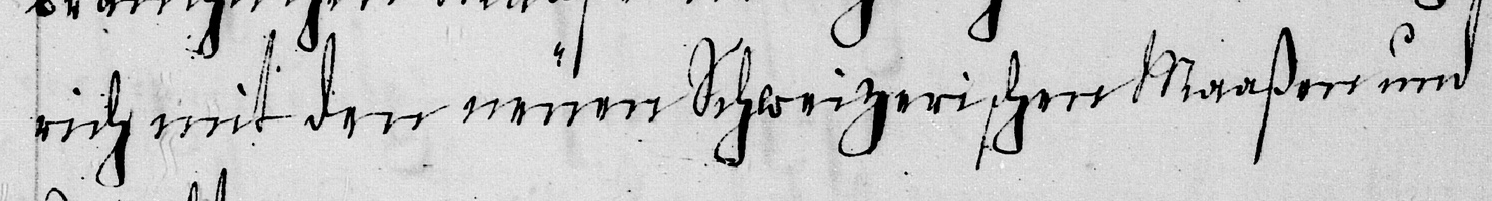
rich mit den neuen Schweizerischen Maaßen und
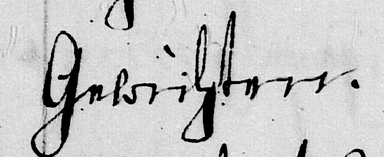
Gewichten.
